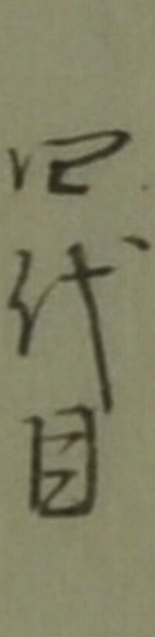四代目
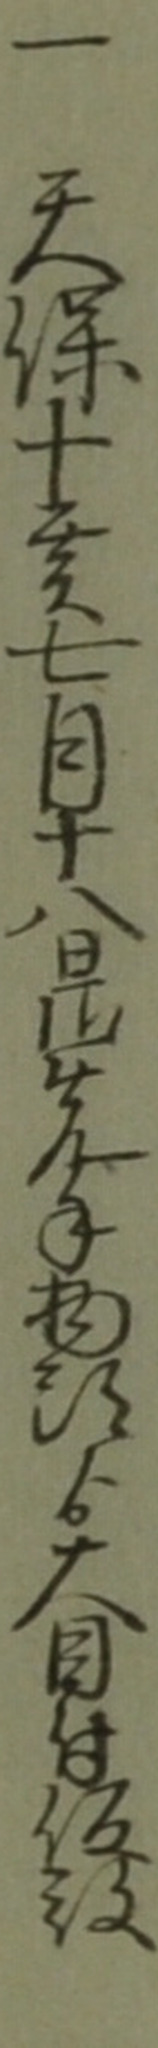一天保十亥七月十八日御先手物頭ゟ大目付仮役
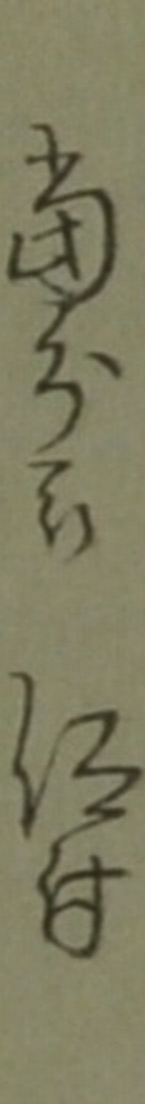当分被仰付
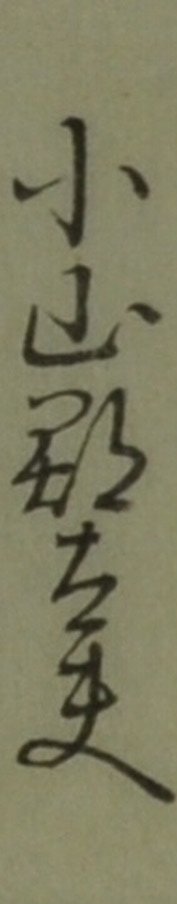小山郡太夫
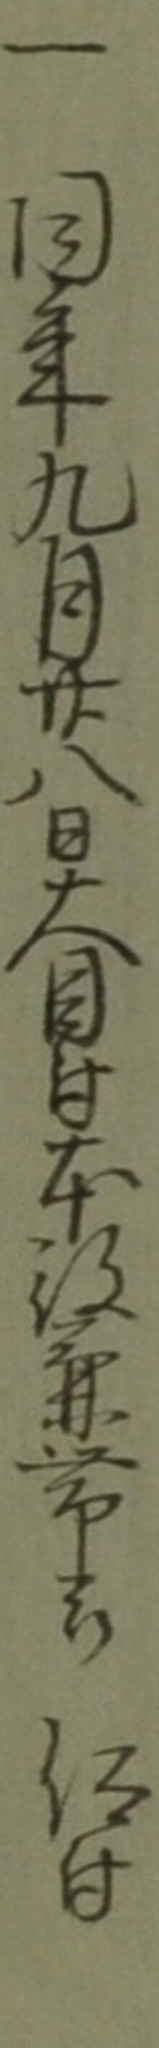一同年九月廿八日大目付本役兼帯被仰付
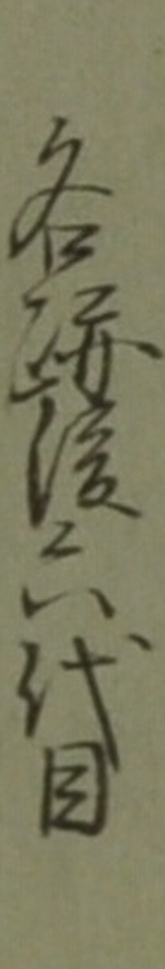名跡後六代目
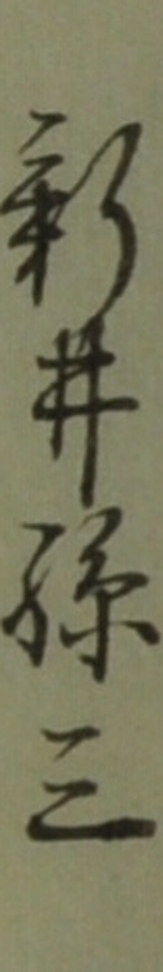新井孫三
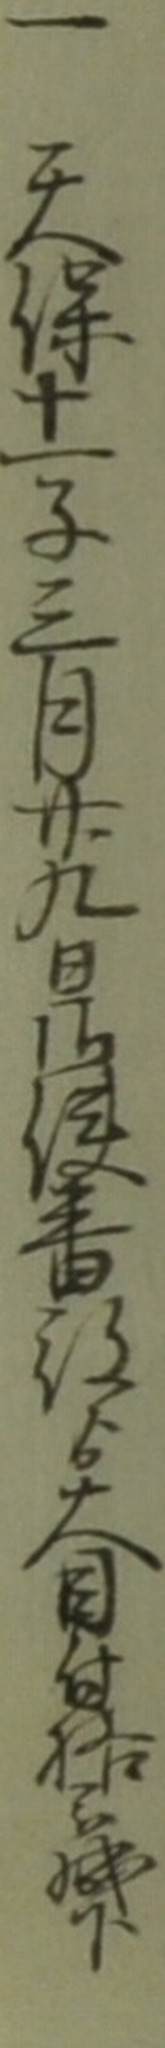一天保十一子三月廿九日御使番役ゟ大目付格被成下
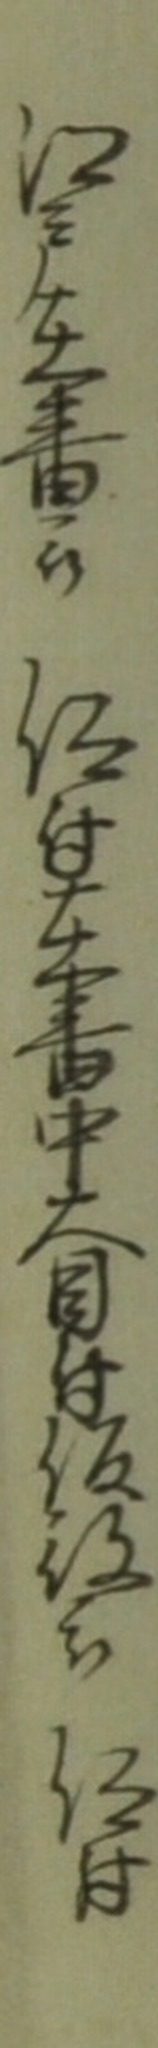江戸在番被仰付在番中大目付仮役被仰付

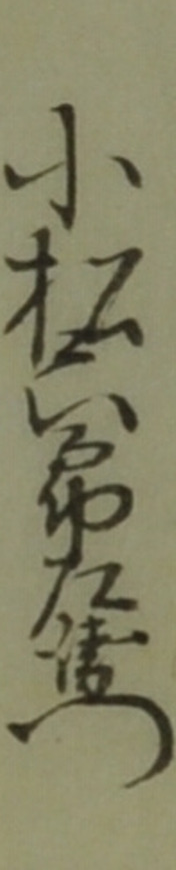小松六郎左衛門
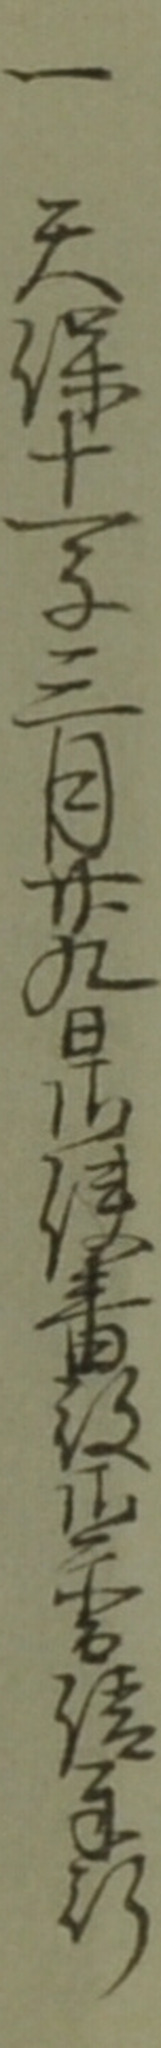一天保十一子三月廿九日御使番役御普請奉行
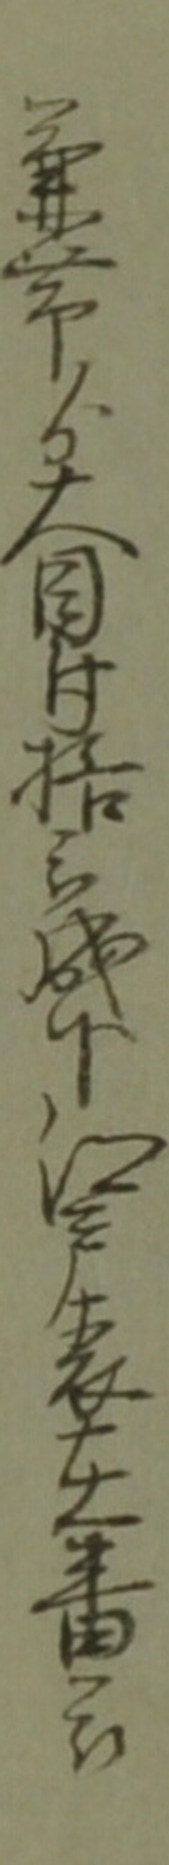兼帯ゟ大目付格被成下江戸表在番被
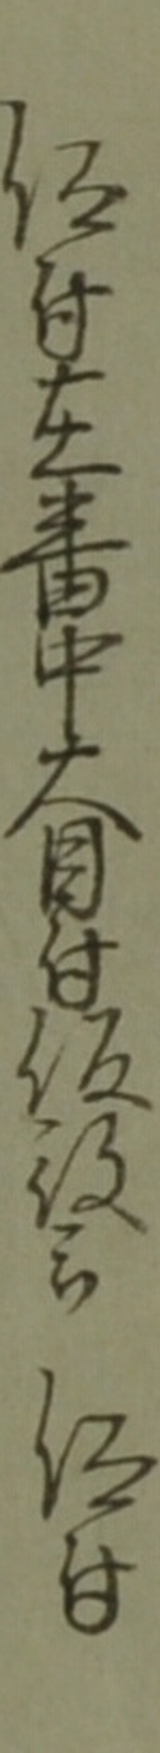仰付在番中大目付仮役被仰付
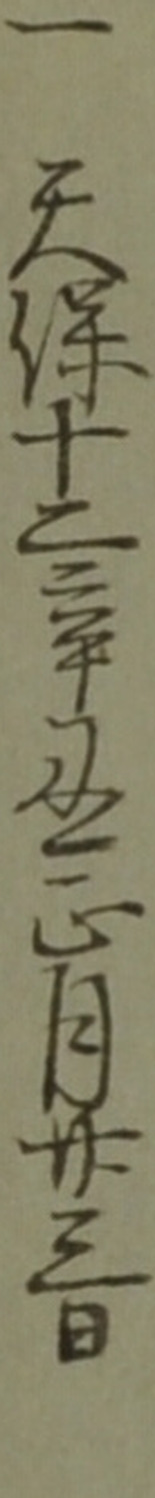一天保十二辛丑正月廿三日
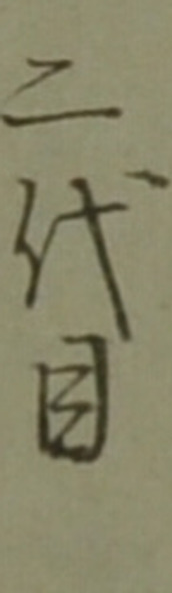六代目
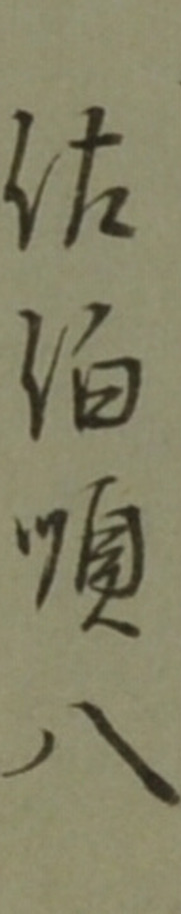佐伯順八
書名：諸御役代々録（三）
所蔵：伊那市立高遠町図書館・合同会社AMANE
